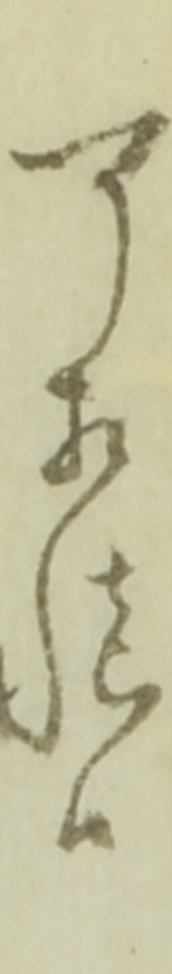可相慎候
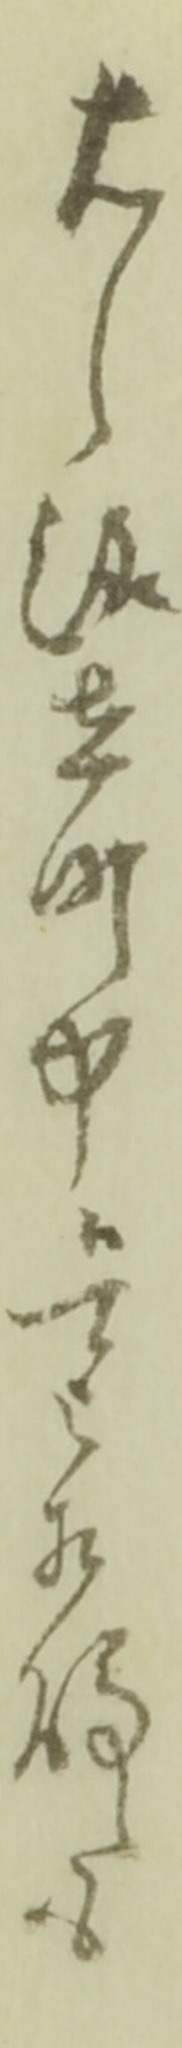右之趣在町中え可被相触候以上
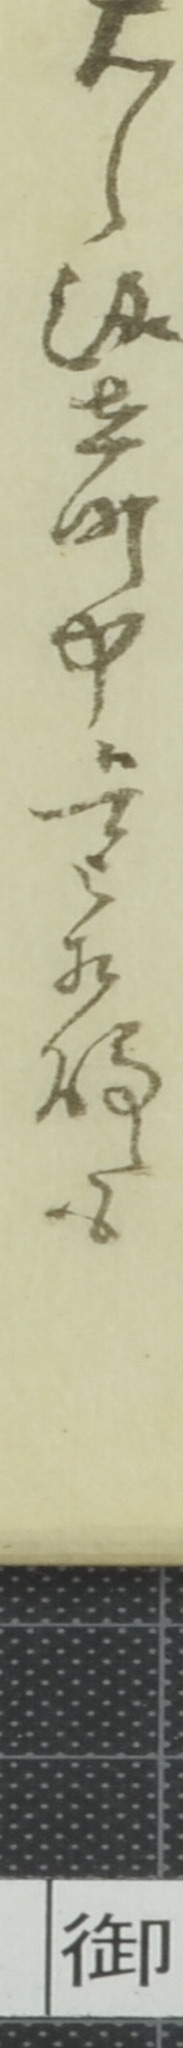右之趣者町中へ可被相触候以上
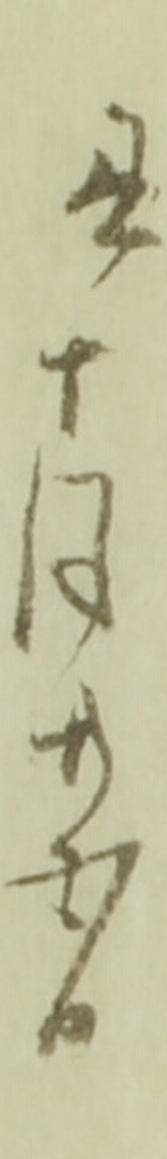丑十月廿五日
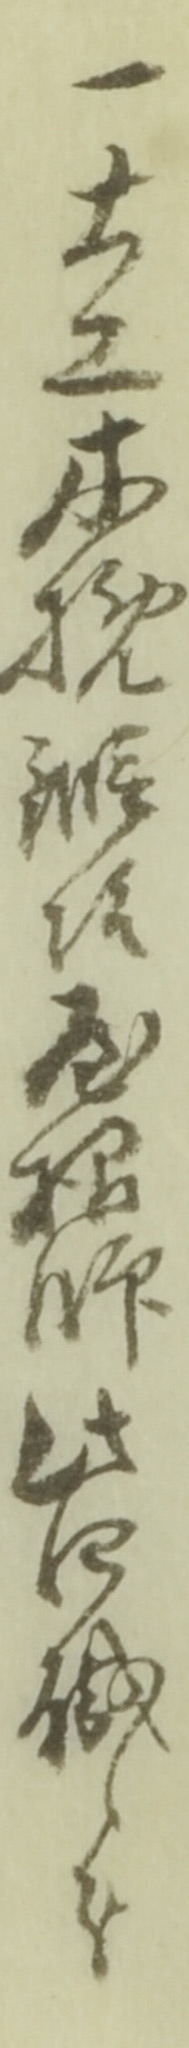一大工木挽鍛冶屋左官師此四職之儀
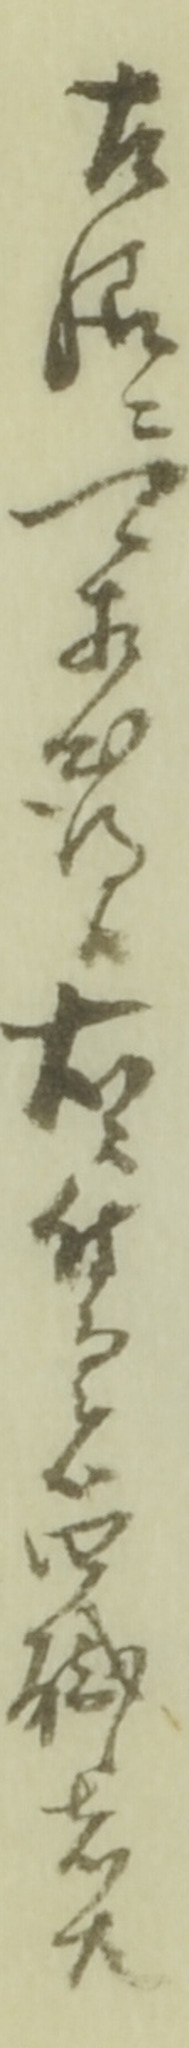左様二可相出存候右二付而者四職之者共
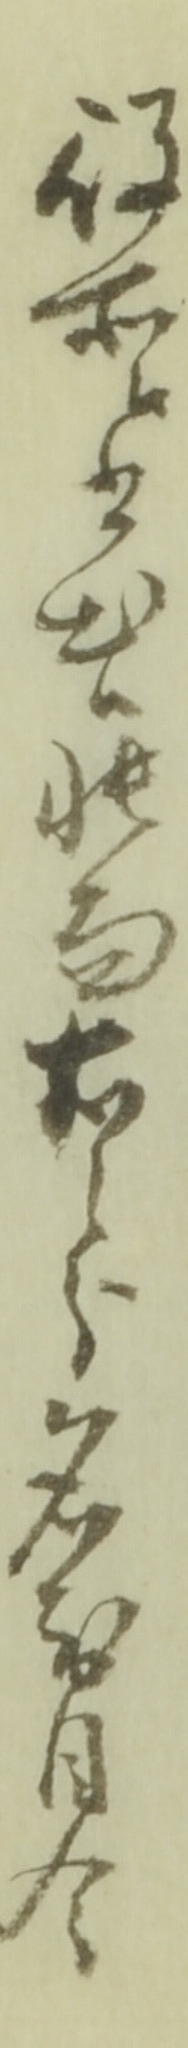役所え指出候帳面右之分名前自今
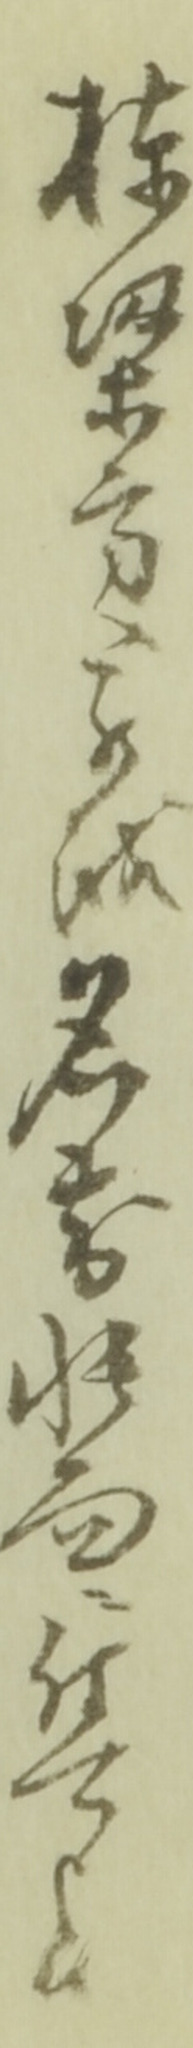棟梁方え罷越名寄帳面二付可申候
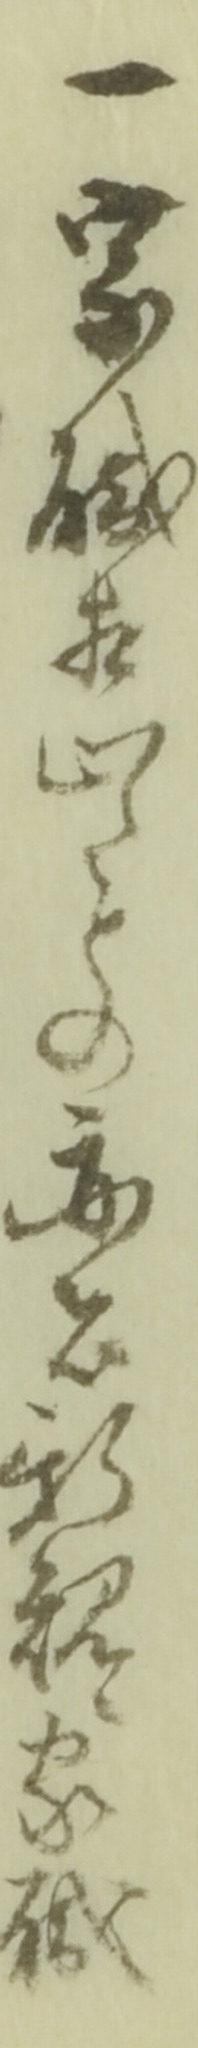一家職相止候もの亦者親類二家職
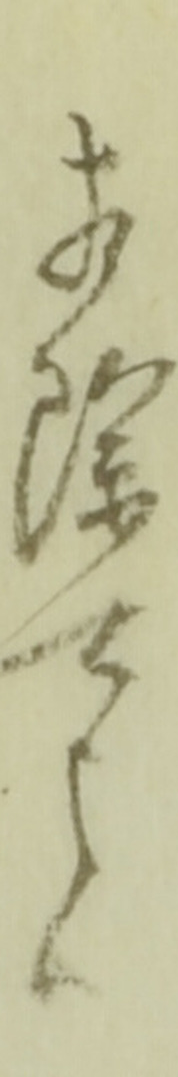相除可申候
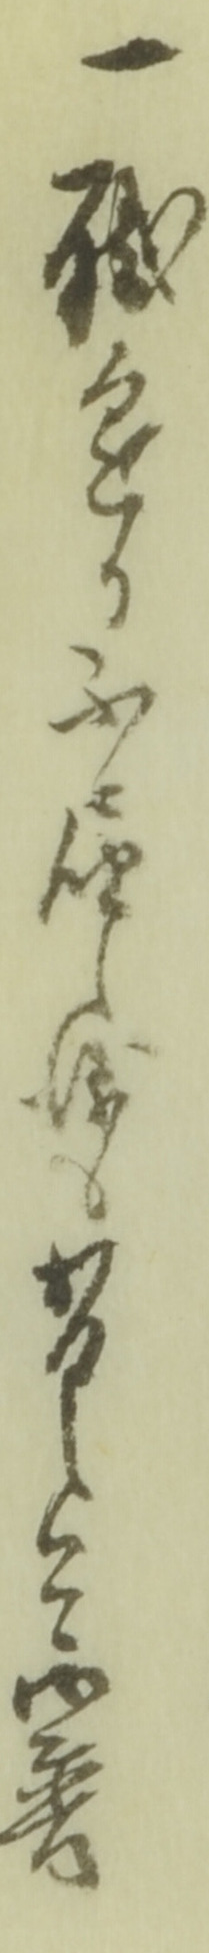一職懸り不届候儀も有之候ハハ御普
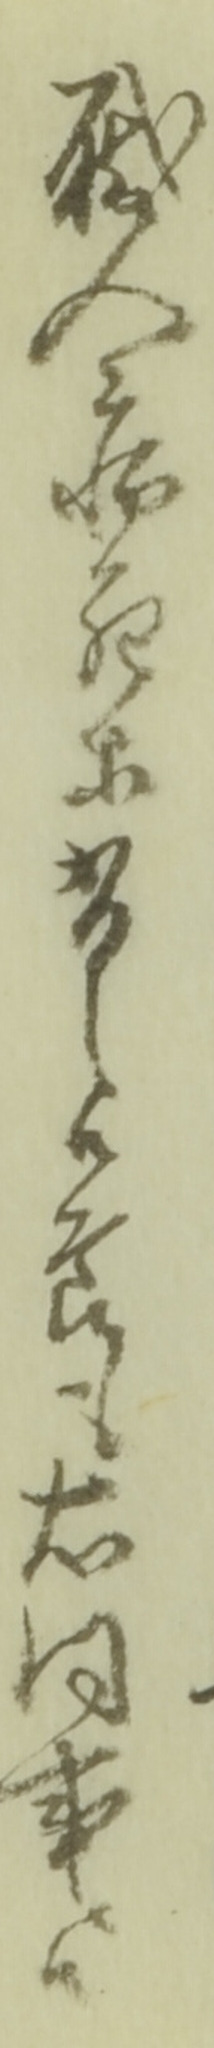職人病抱等有之候節も右同事二候
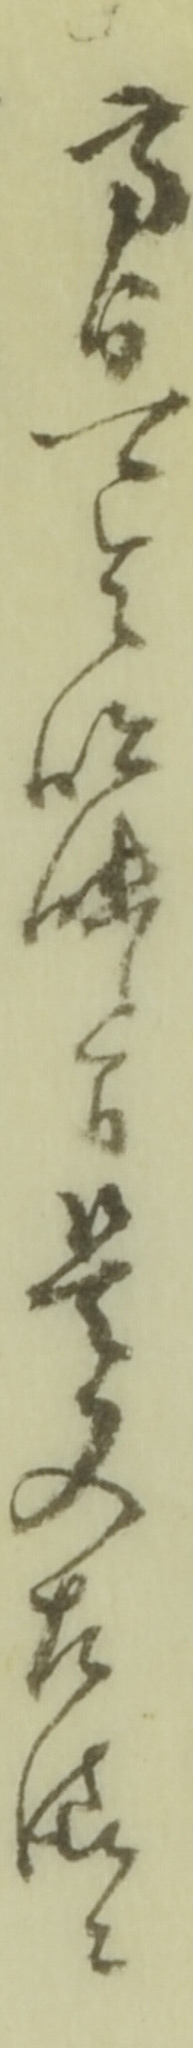方より可令吟味候旨之又左様二
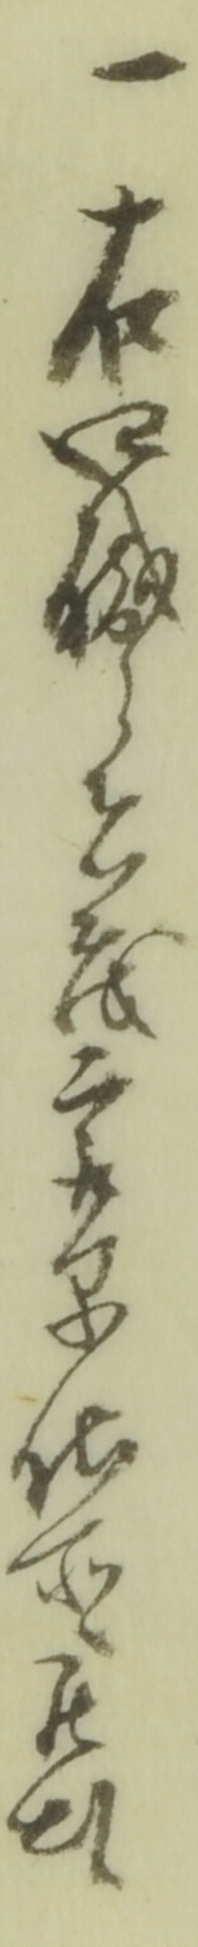一右四職候者茂最早仕所二罷出候
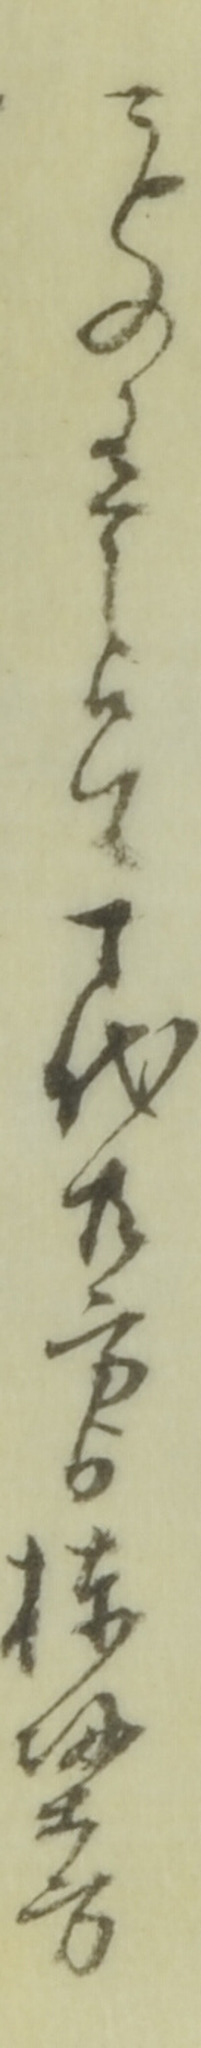もの有之候ハハ手代共方より棟梁方
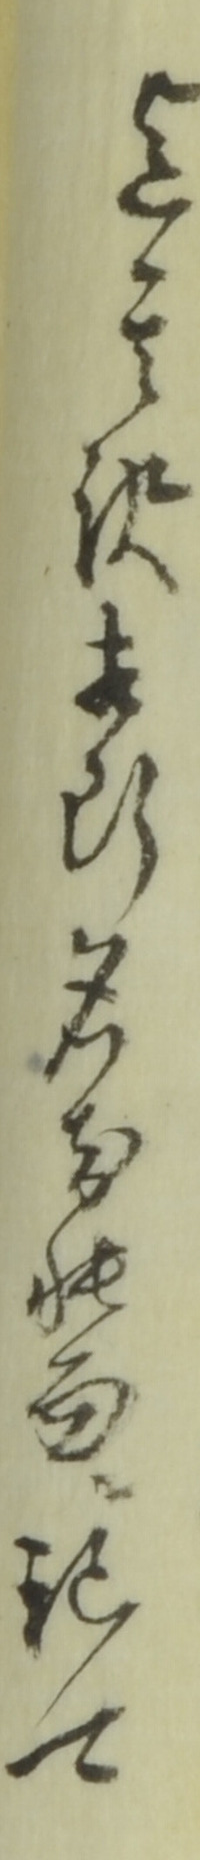迄其決相改名前帳面二記可
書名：御公儀様御領主様御触書控
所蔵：伊那市立高遠町図書館・合同会社AMANE
